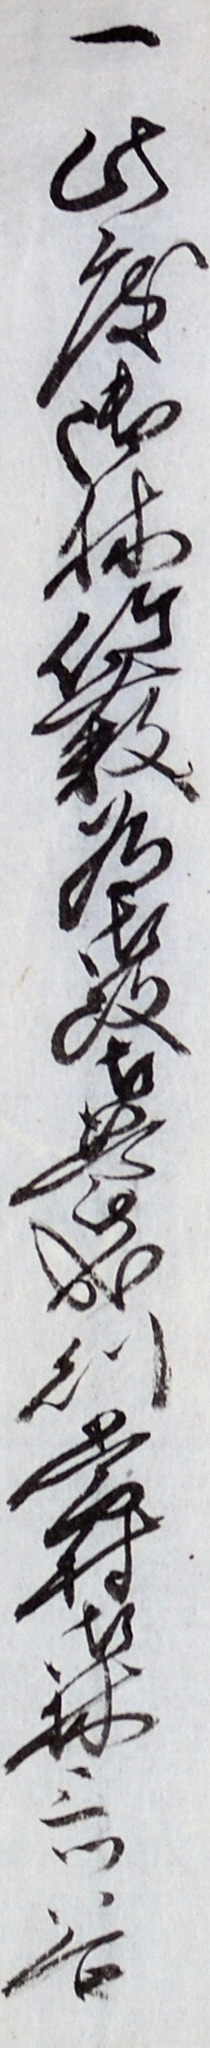一此度御林竹薮為御改御廻り被成則当村御林三ツ谷
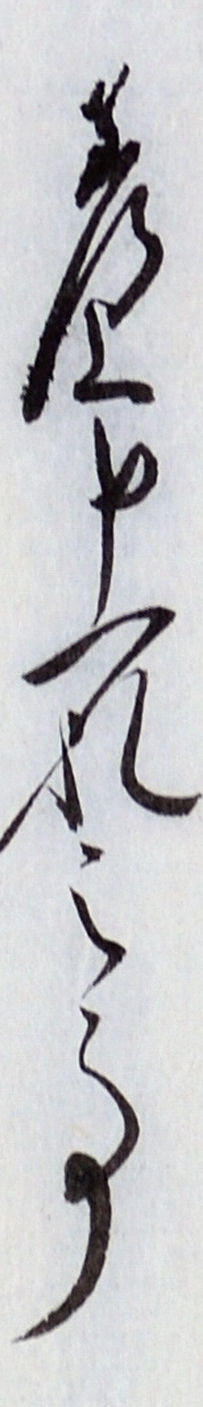差上申一札之事
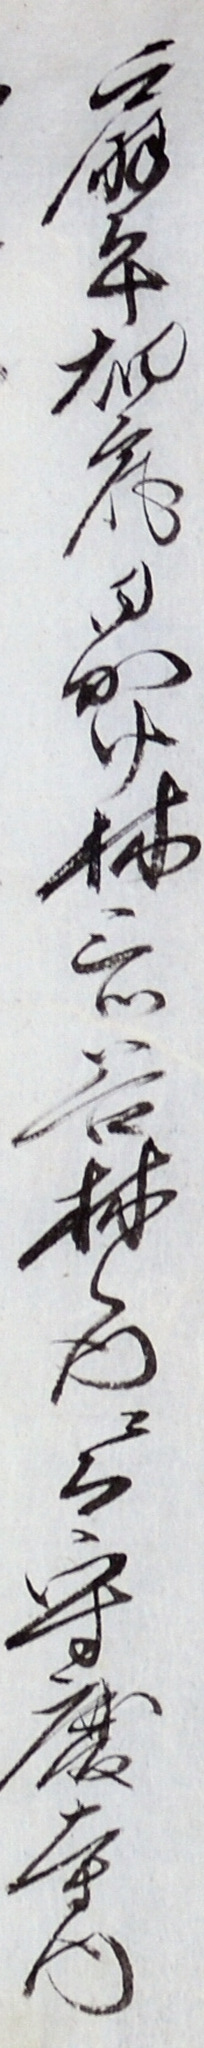扇平畑尻日かけ林三ツ谷林之内ニ而守慶寺内
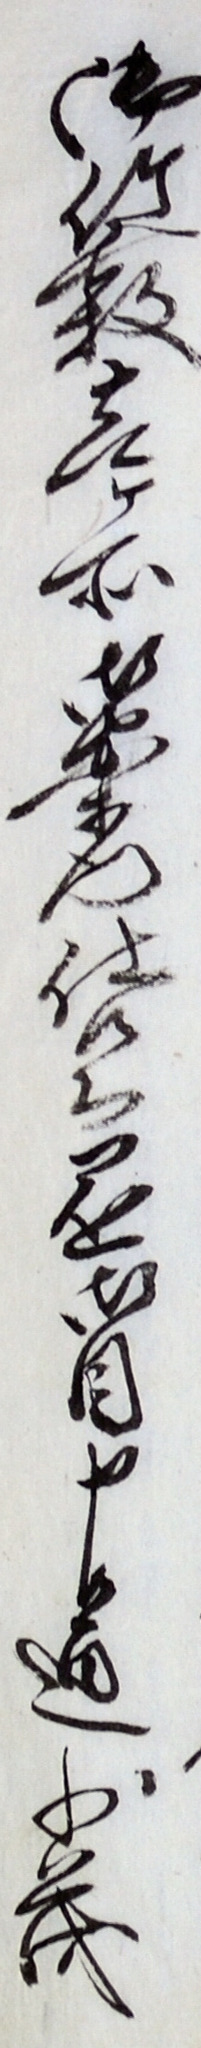御竹薮壱ヶ所御案内仕候而懸御目申候通少も

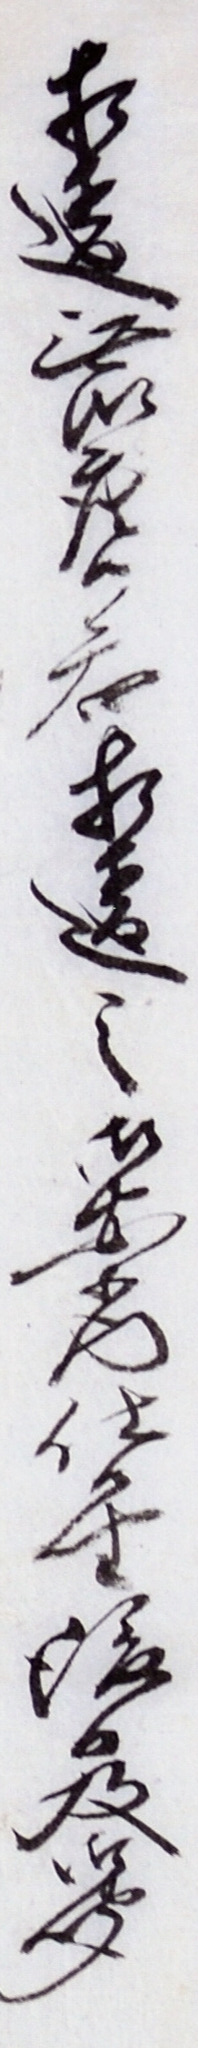相違無御座候若相違之御案内仕候由後日及御聞
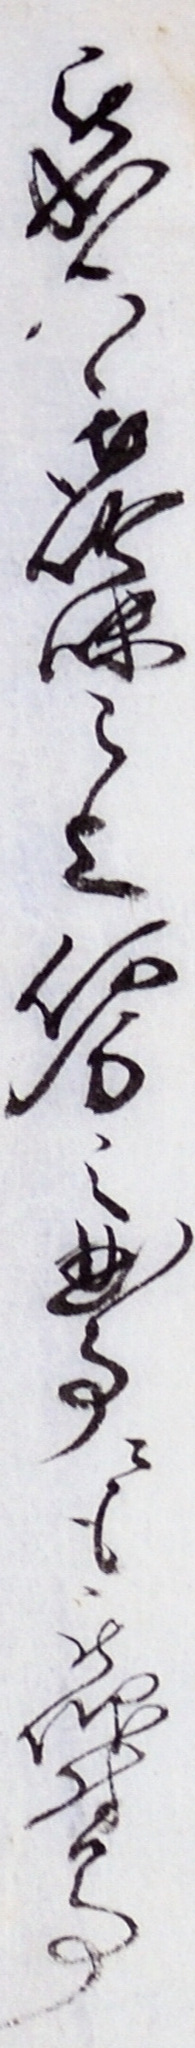被成候ハヽ御吟味之上何分之曲事ニも被仰付候事
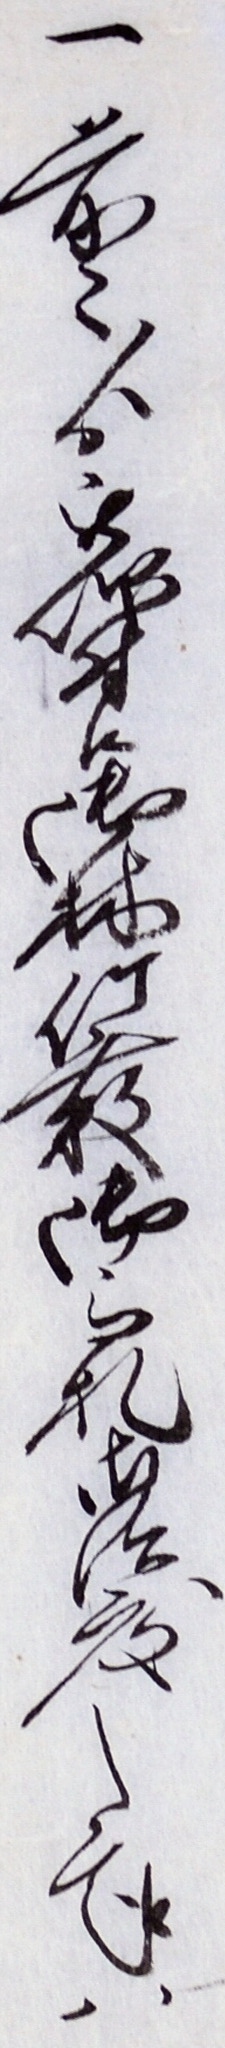一前々ゟ被仰付候御林竹薮御高札御法度之趣ハ
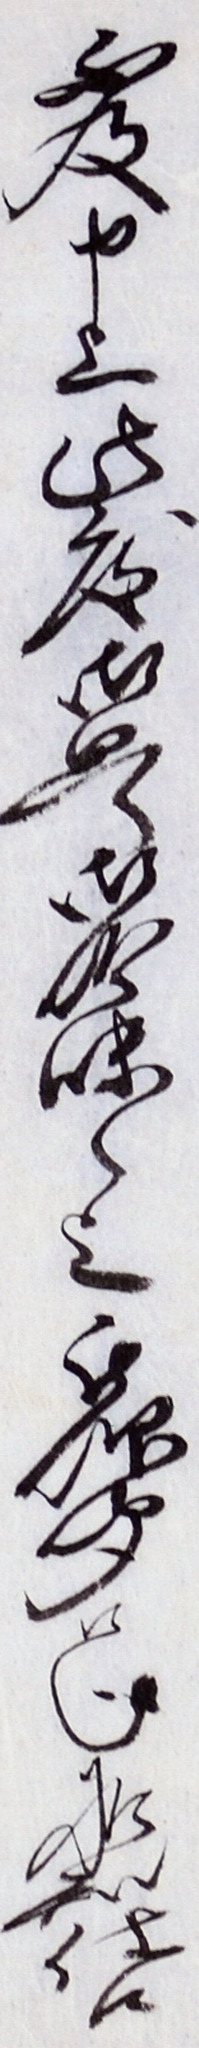不及申上此度御廻り御吟味之上被仰聞候趣承知仕候
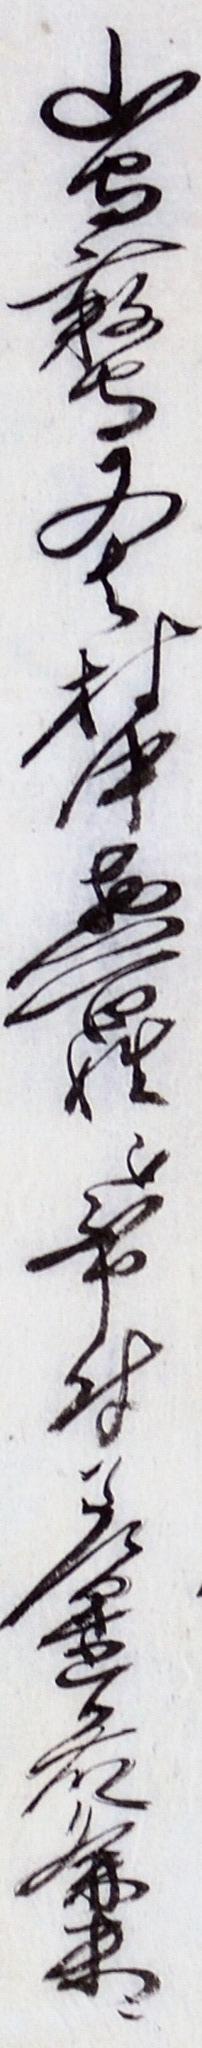山守薮守又は村中惣百姓え不申付差置候故麁末ニ
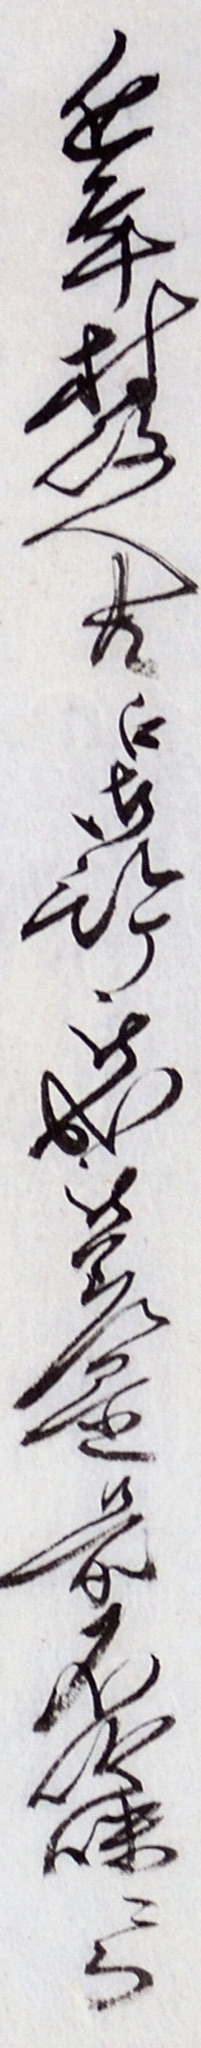近年村役人共え御預ヶ被成被差置候所不吟味ニ而
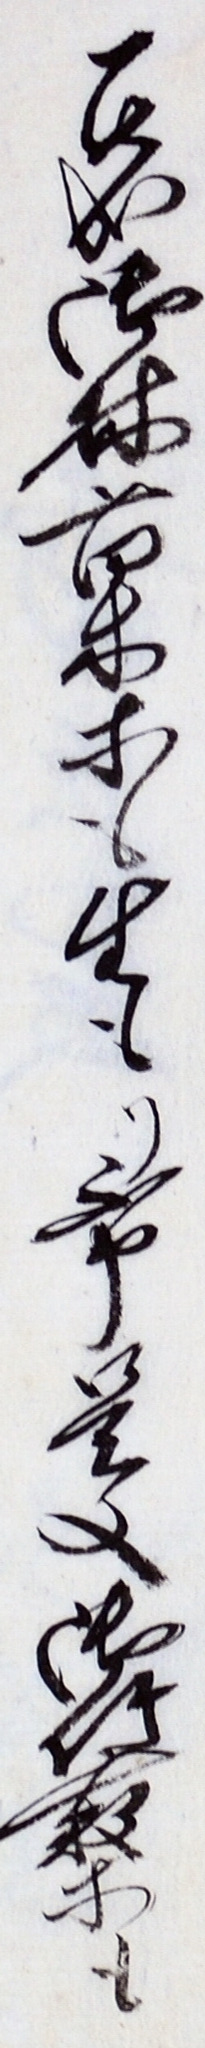罷成御林苗木等も生もり不申是又御竹薮等も
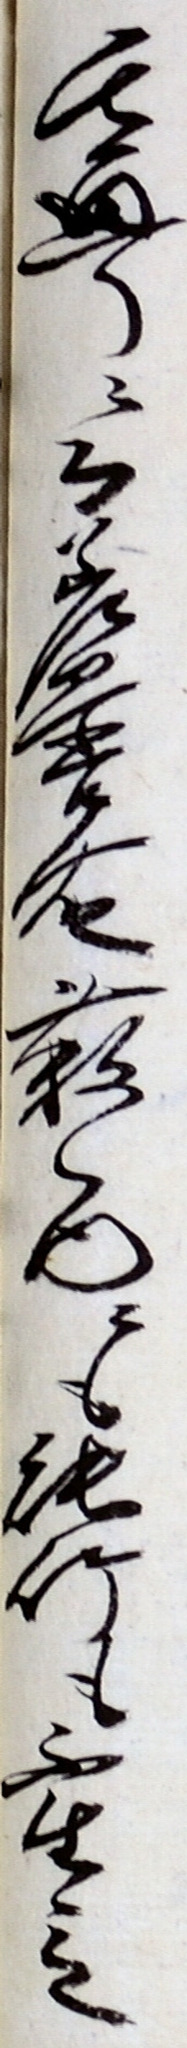其通りニ而差置候故薮之内ニも能竹も不生立
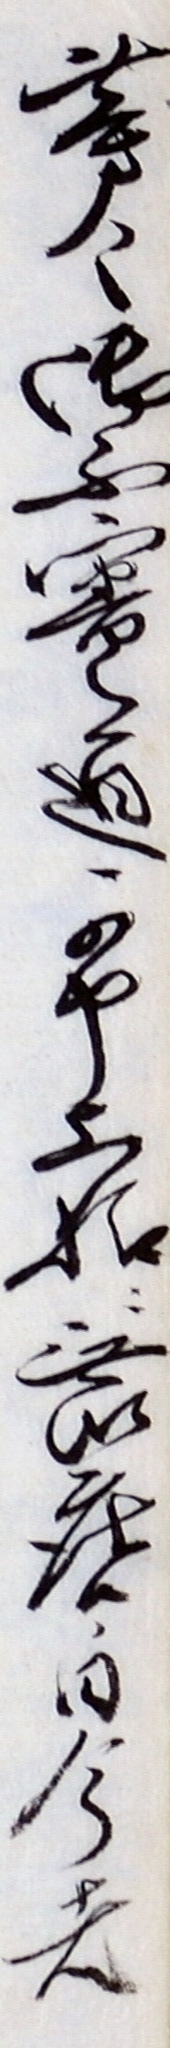等々御不審之通可申上様ニ無御座候自今は
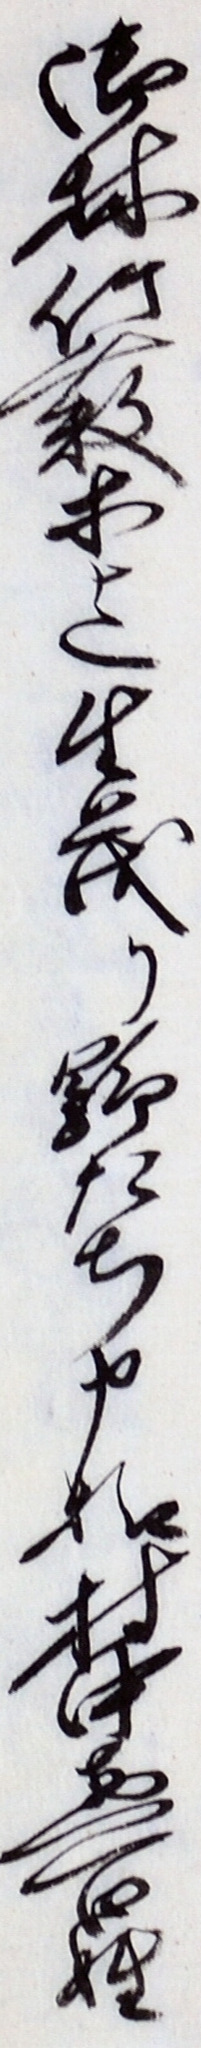御林竹薮等迄生茂り野たち申様村中惣百姓
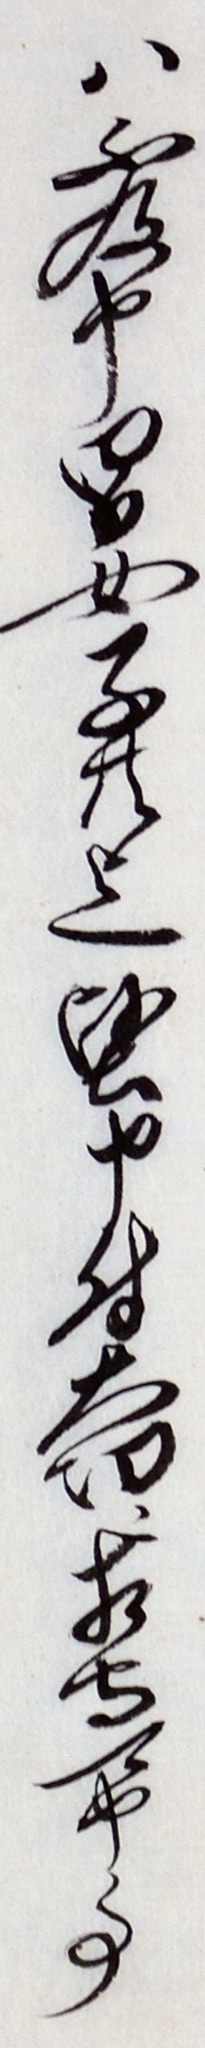ハ不及申男女子共迄堅申付大切ニ相守可申事
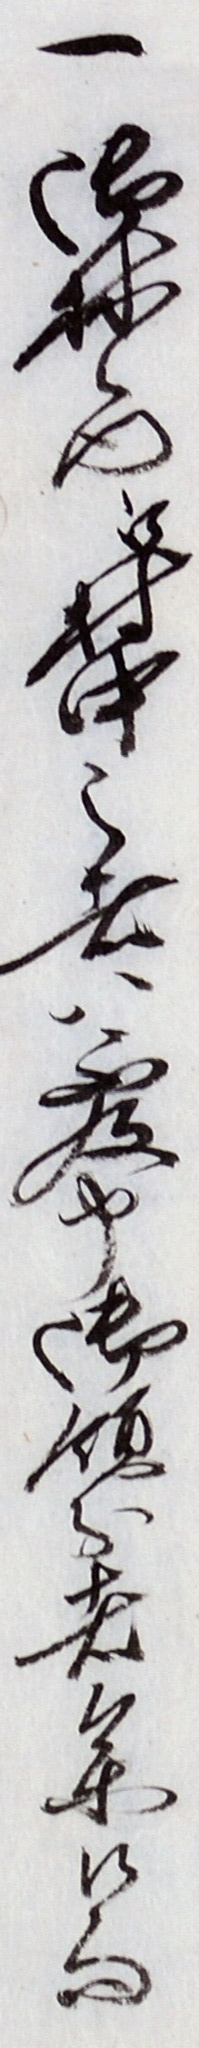一御林之内え村中之者ハ不及申御領分者参候而
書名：御林御竹藪証文控
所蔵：伊那市立高遠町図書館・合同会社AMANE
